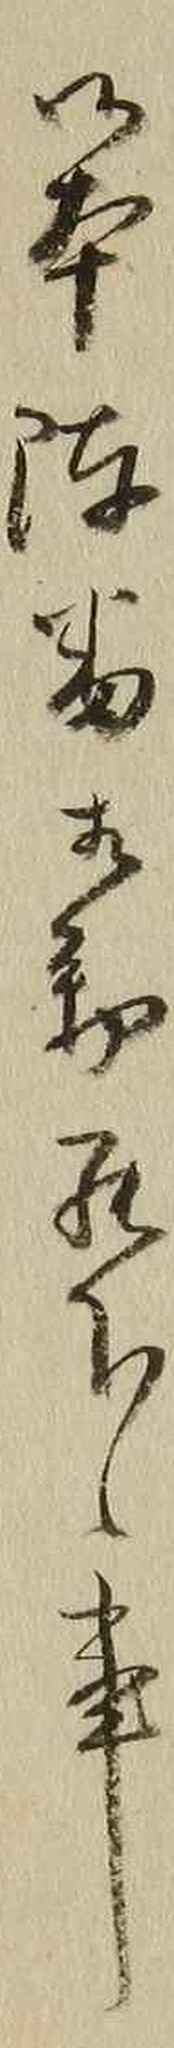御本陣番相勤罷下候事
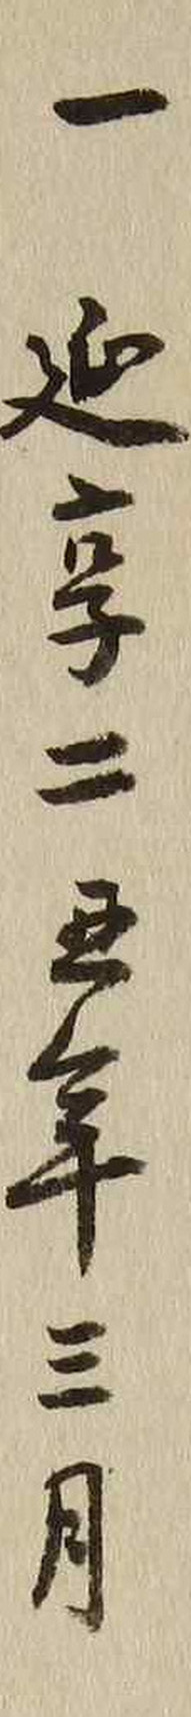一延享二丑年三月
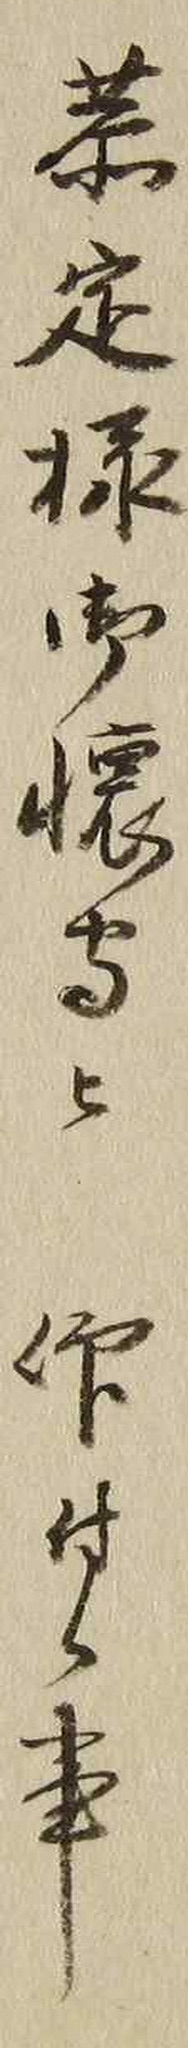恭定様御懐守被仰付候事
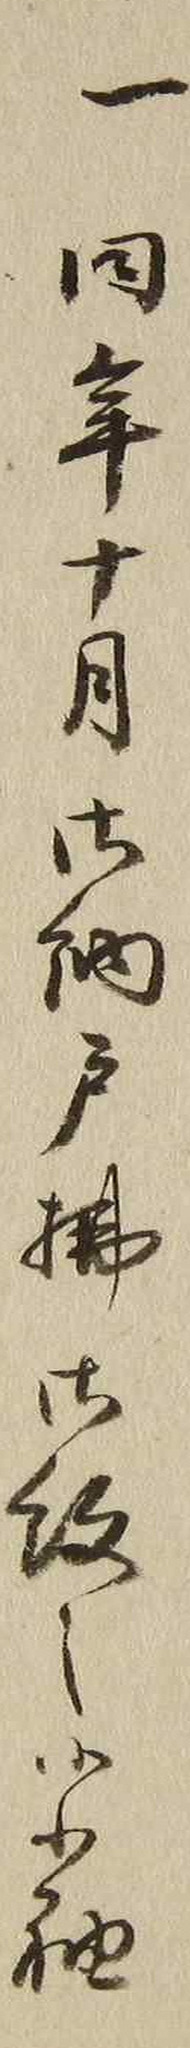一同年十月御納戸払御紋之御小袖
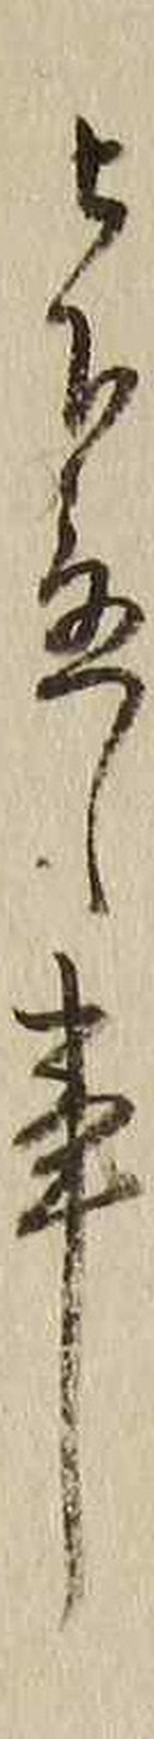被下置候事
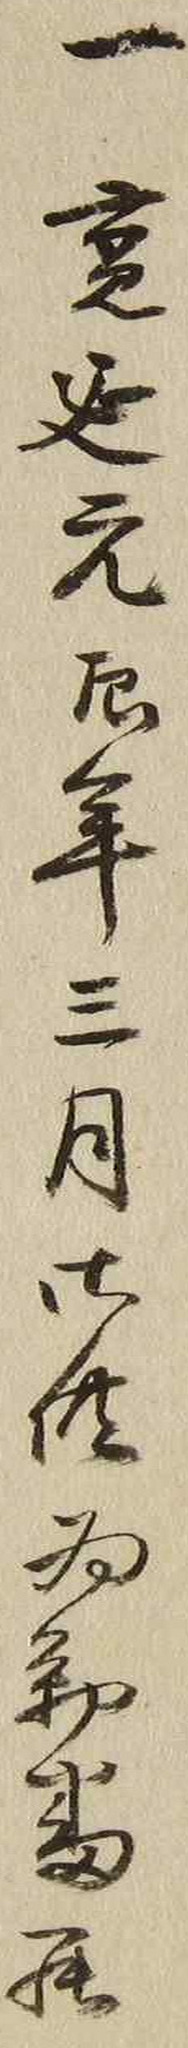一寛延元辰年三月御供為勤番罷
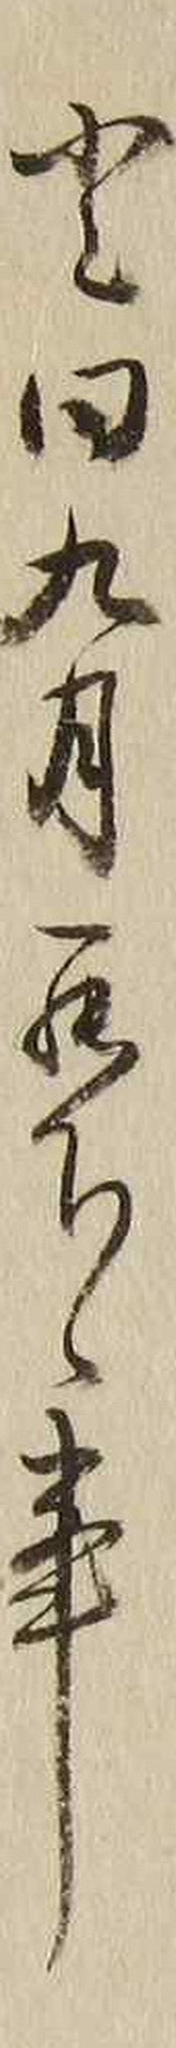登同九月罷下候事
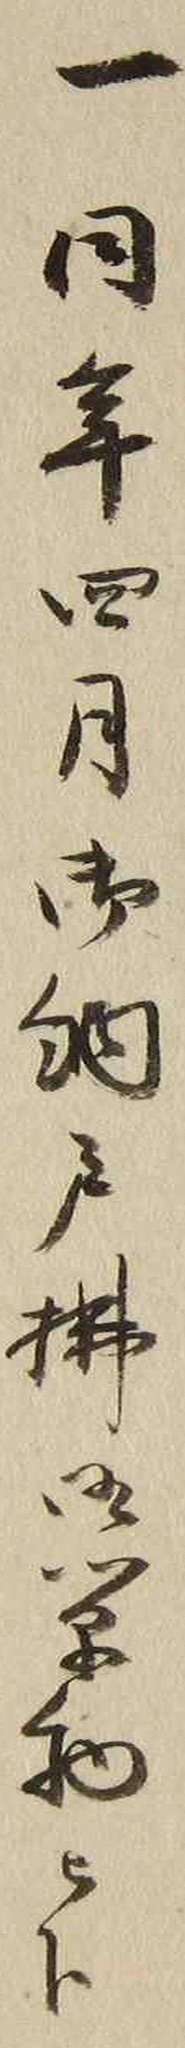一同年四月御納戸払御単物被下
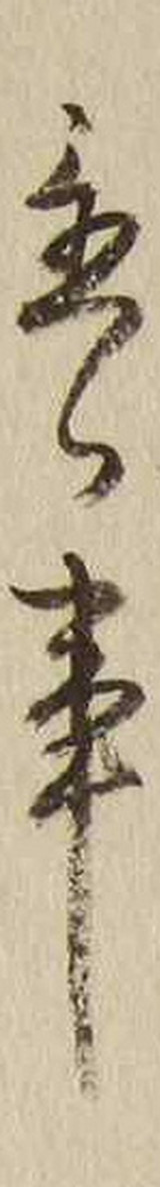置候事
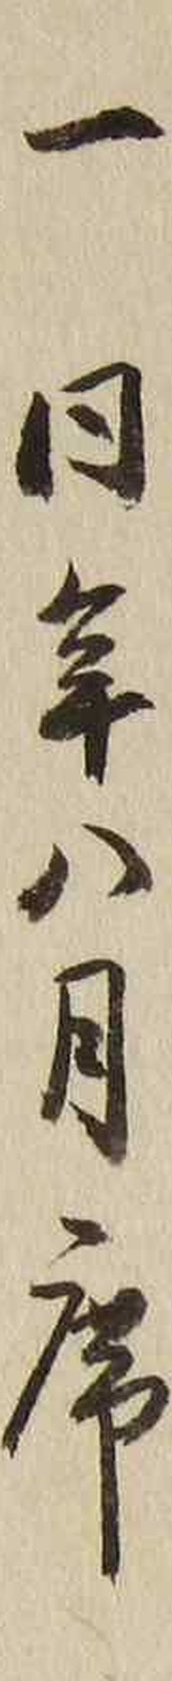一同年八月席
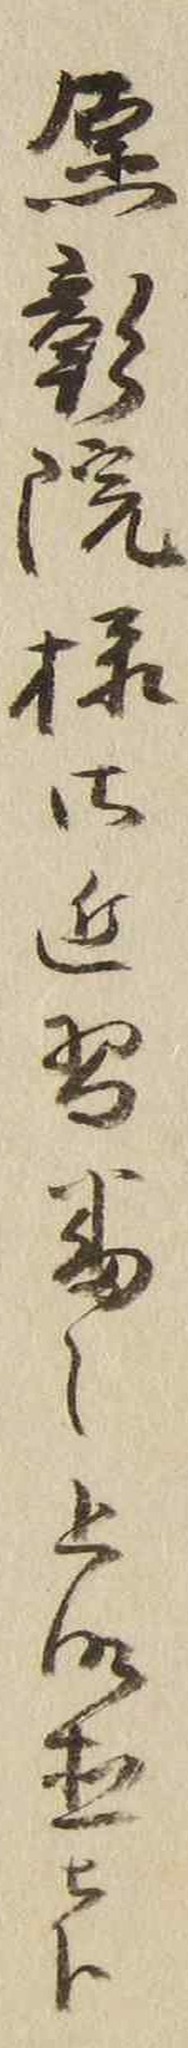愿彰院様御近習番之上御直被下

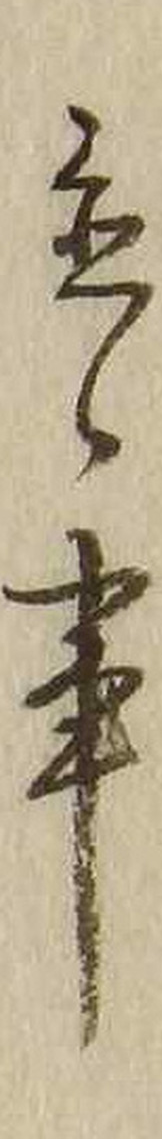置候事
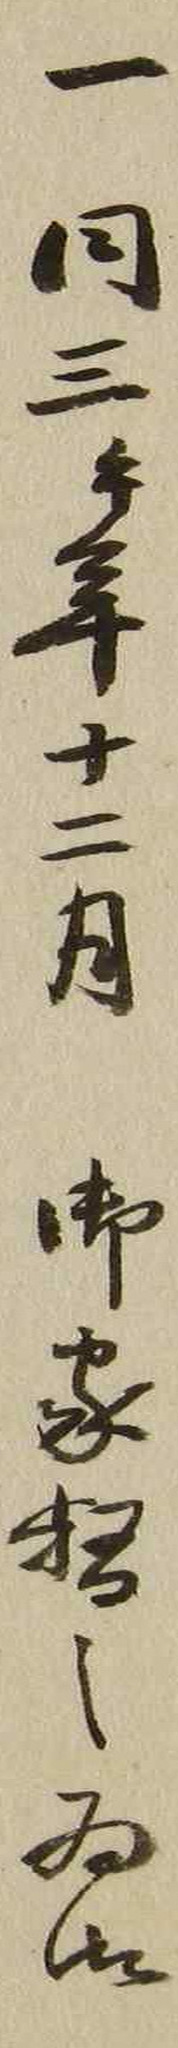一同三午年十二月御家督之為御
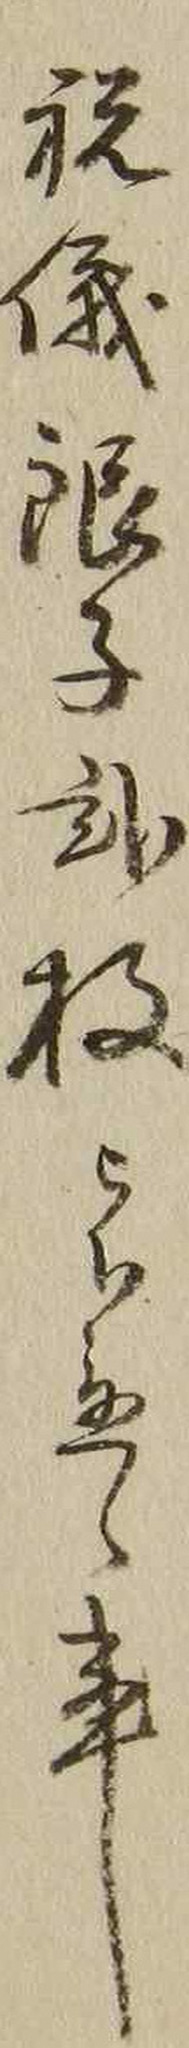祝儀銀子弐枚被下置候事
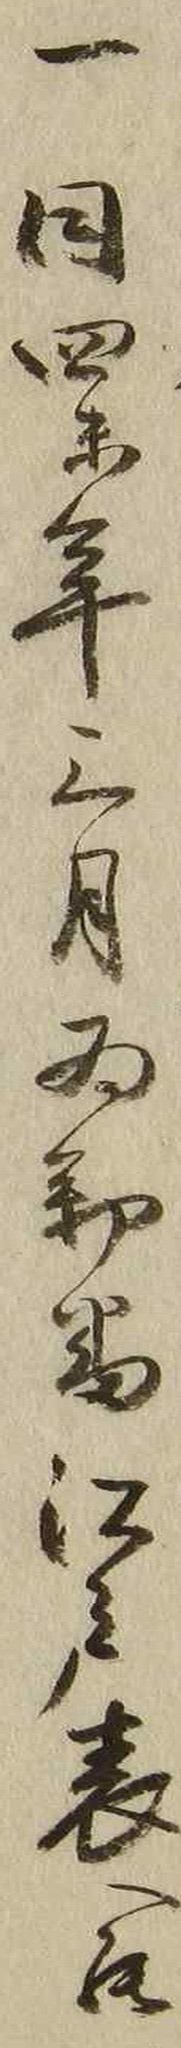一同四未年三月為勤番江戸表へ罷
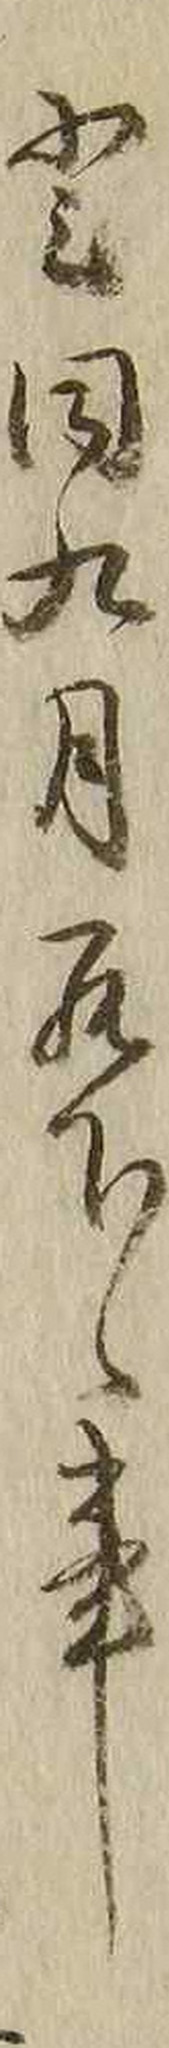登同九月罷下候事
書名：諸士系譜　巻之236　ふ之部4
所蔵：会津若松市立会津図書館
